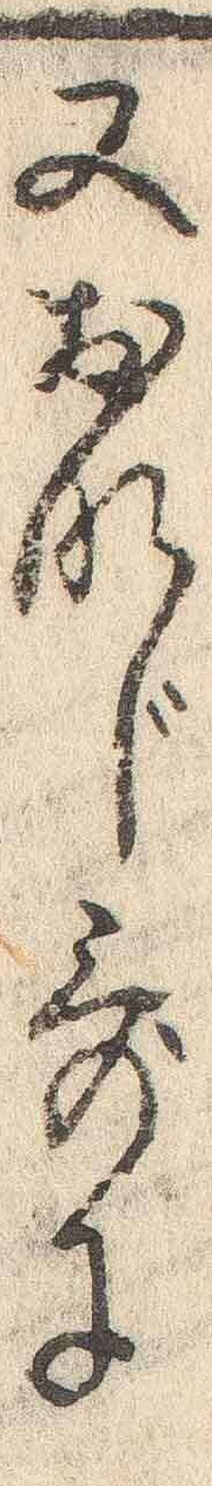又おなじ哥に
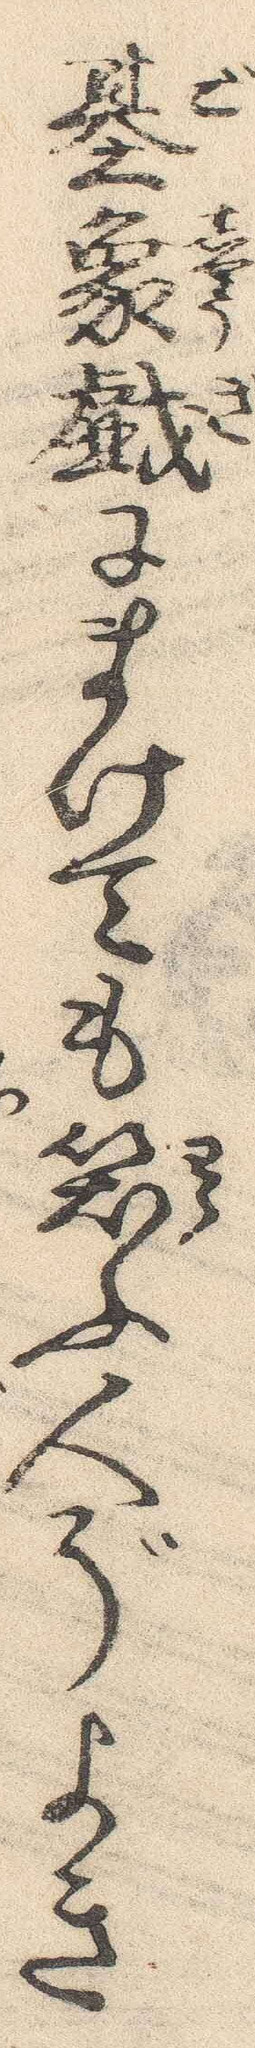基象戯にまけても笑ふ人ぞよき
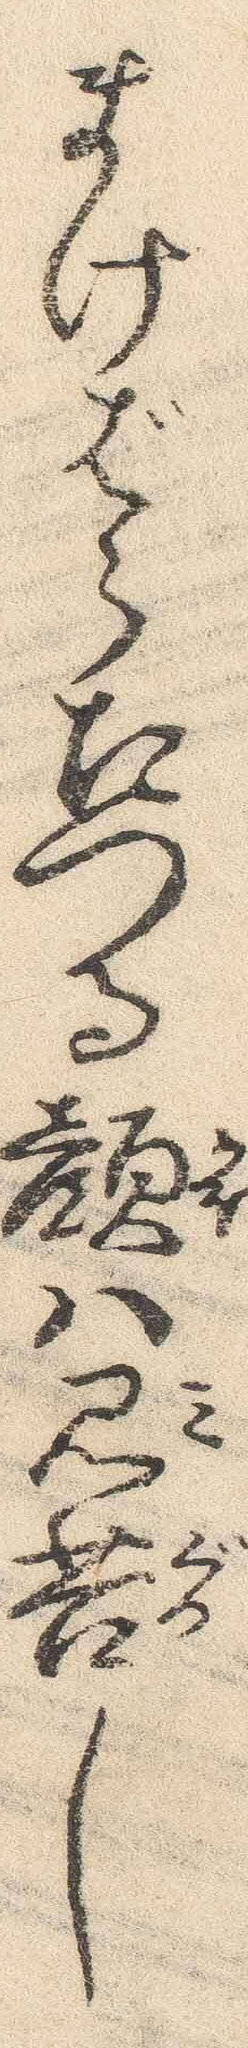まけばらたつる顔は見苦し
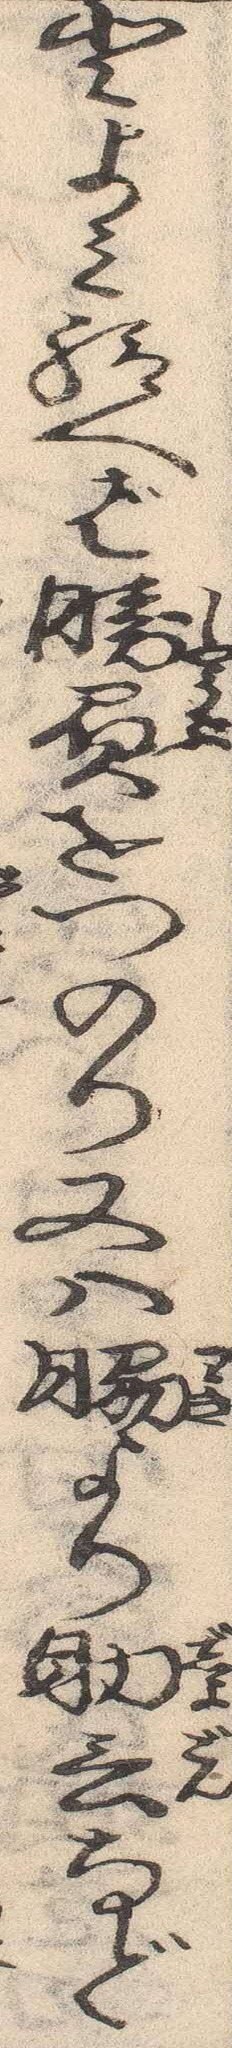とよみ給へば勝負をつのり又は脇より助言など
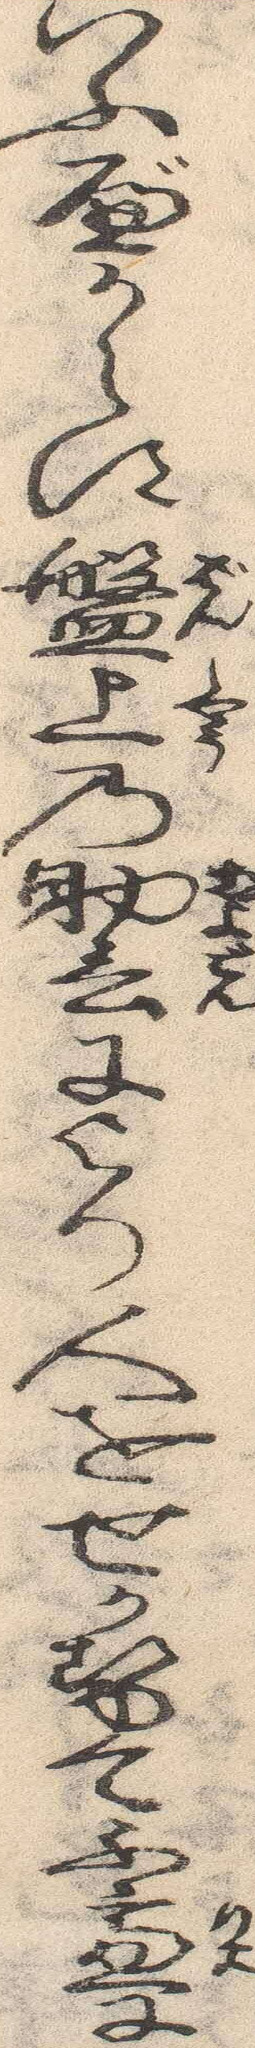いふべからす盤上の助言により人をせかせて不慮に
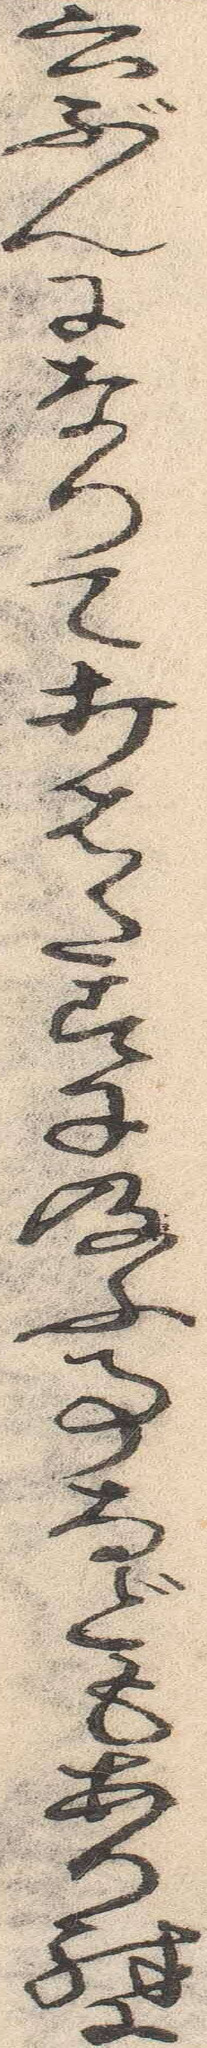云ぶんになりて打はたすに及ふ事などもあり殊に
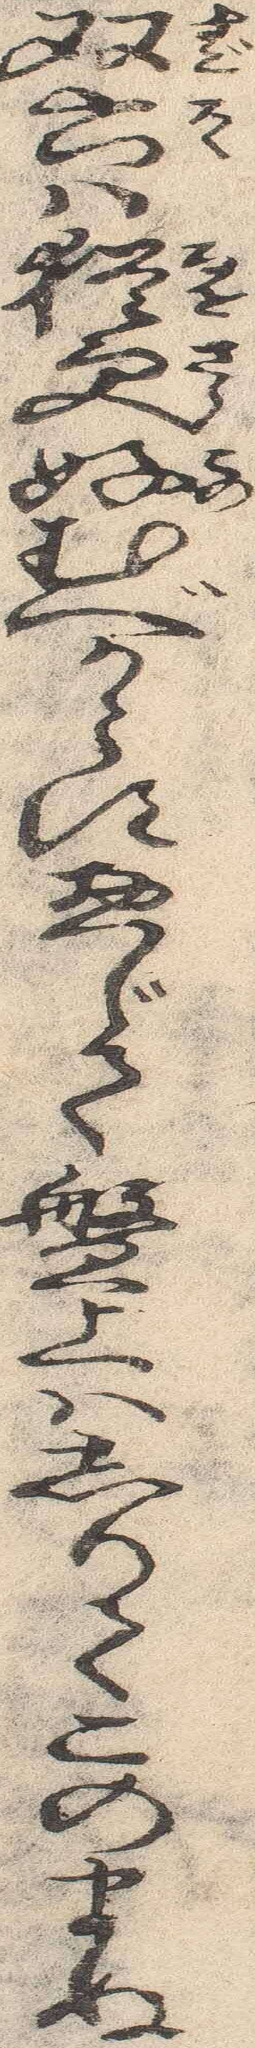双六は猶更好むべからす総じて盤上はしりてこのまぬ
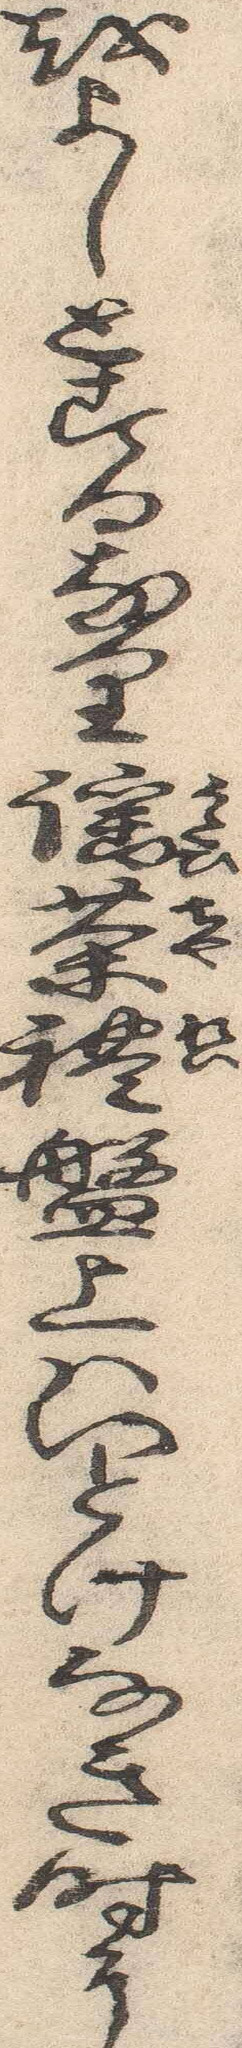をよしとするなり謡茶礼盤上はいとけなき時に
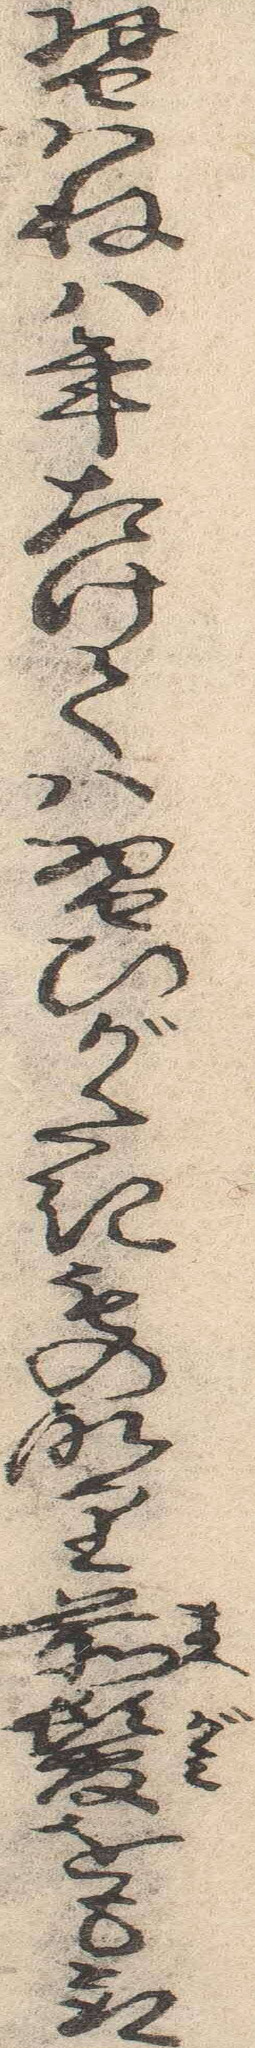習はねは年たけては習ひがたきものなり前髪をも取
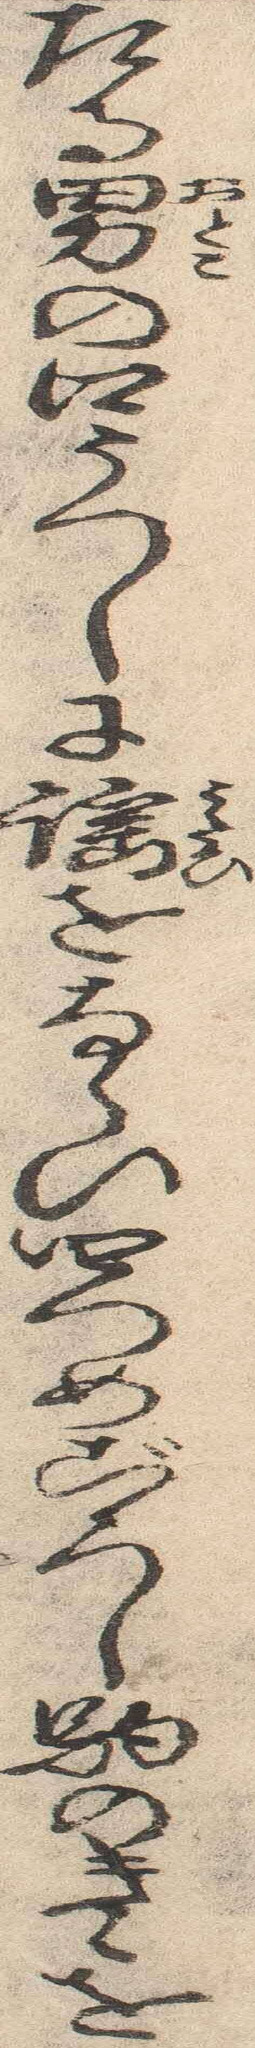たる男の口うつしに謡をならひ四つめごろし駒のきゝを
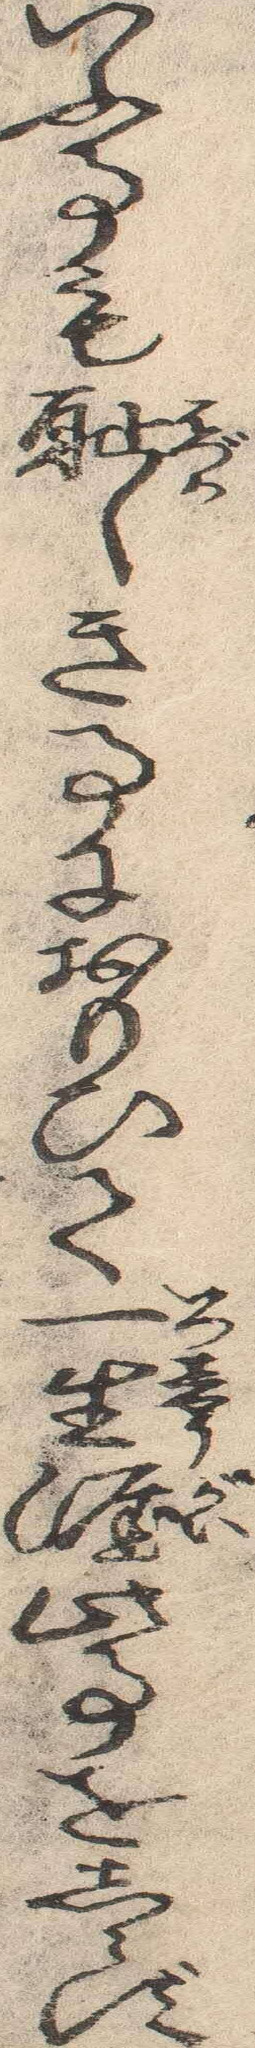いふ事も恥しき事におもひて一生涯此事をしらず
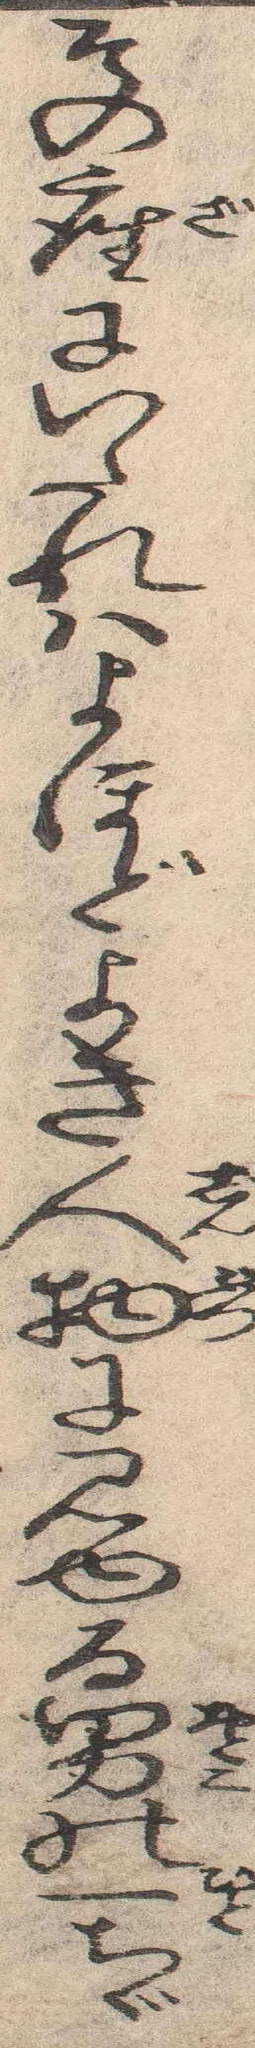その座にいたれはよほどよき人物に見ゆる男の一ちゞ
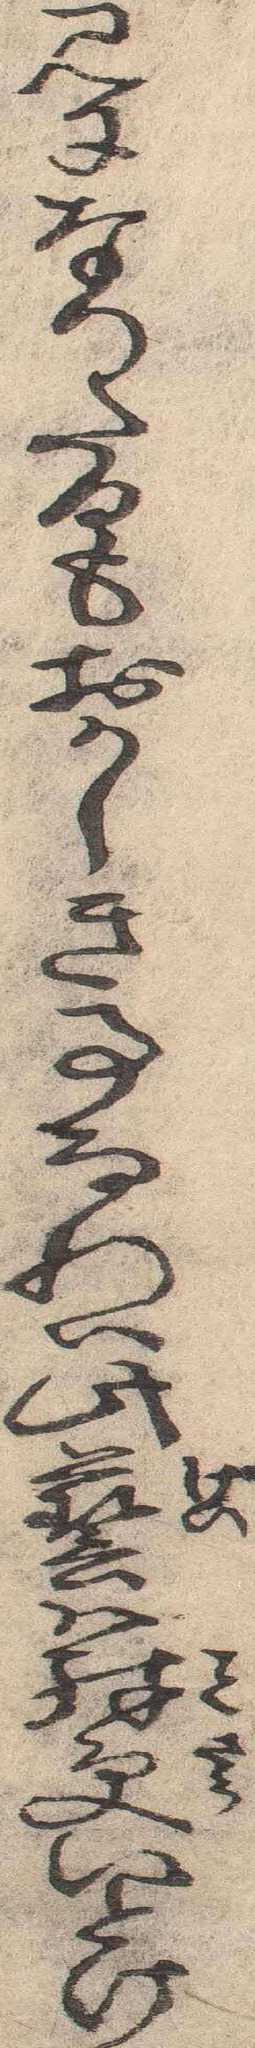みになりたるもおかしき事なれは此芸は殊更いとけ
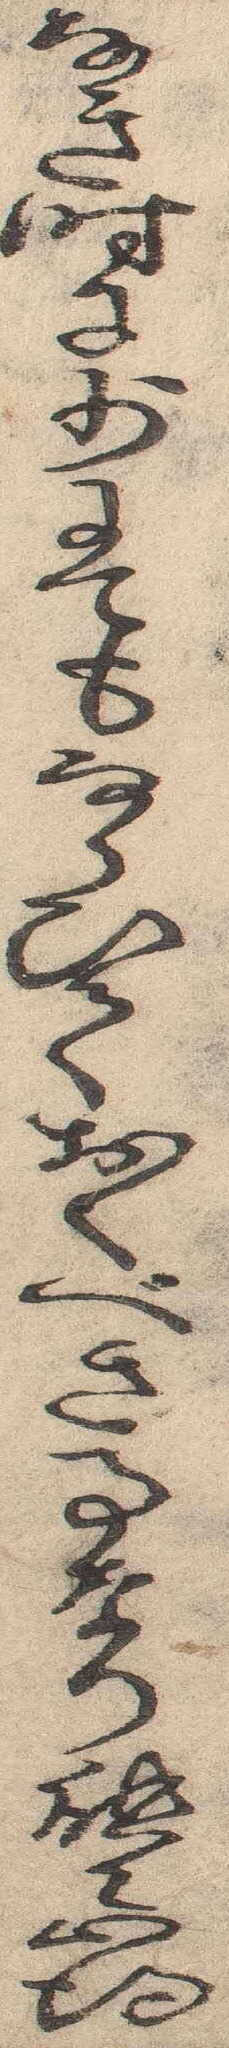なき時に少にてもならひておくべき事なり能々心得

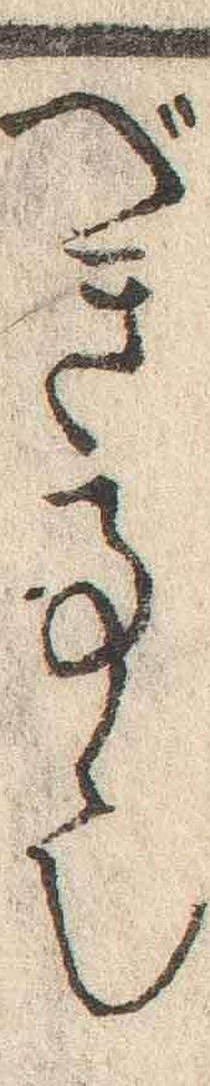べき事也
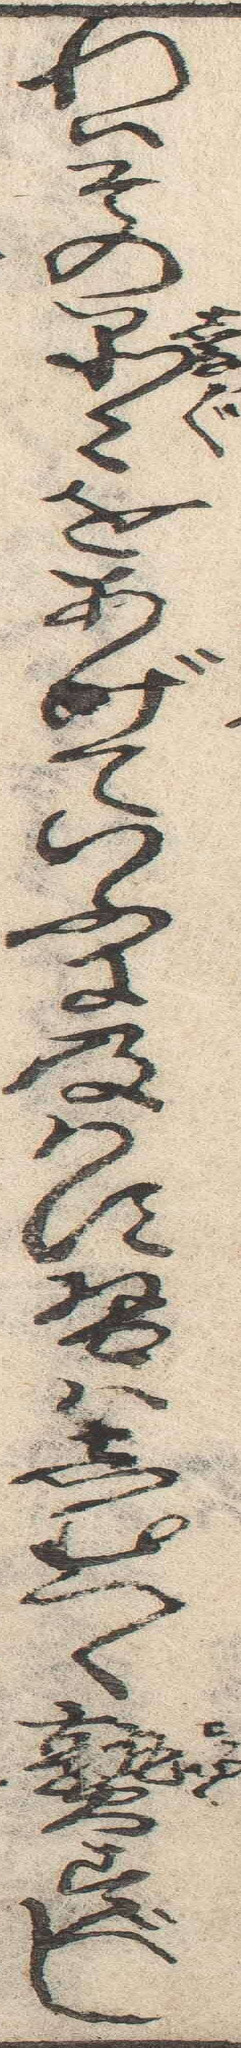れはその品々をあげていふに及はす習はしむへく熟すべし
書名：小児必用養育草
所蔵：東京学芸大学附属図書館 国文学研究資料館
